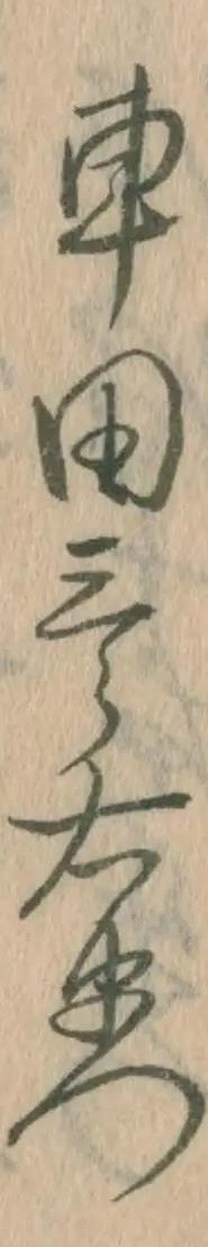車田三郎右衛門
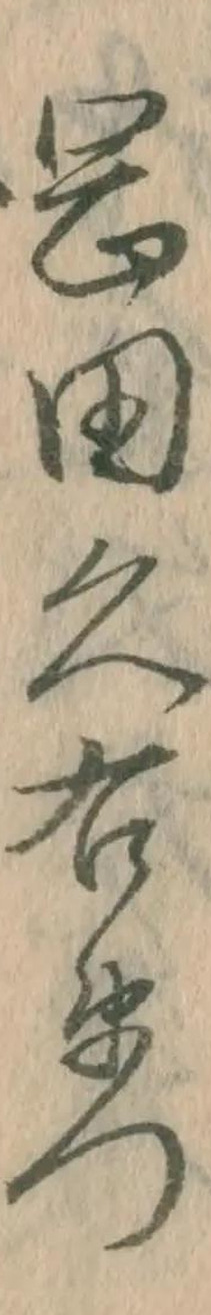岡田久右衛門
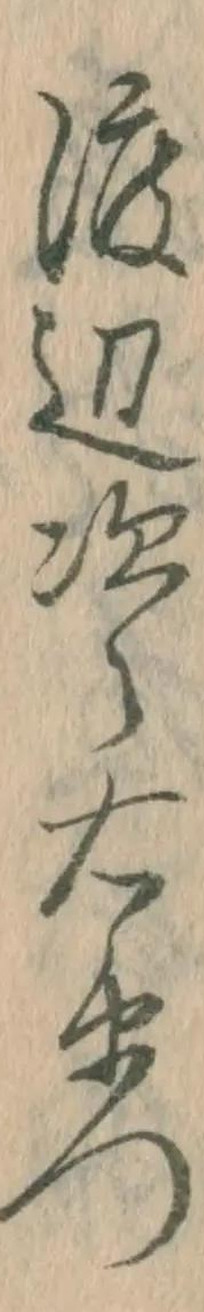渡辺次郎右衛門
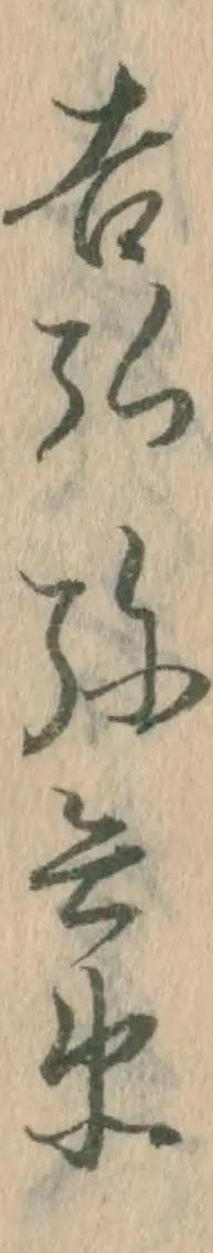吉弘弥兵衛
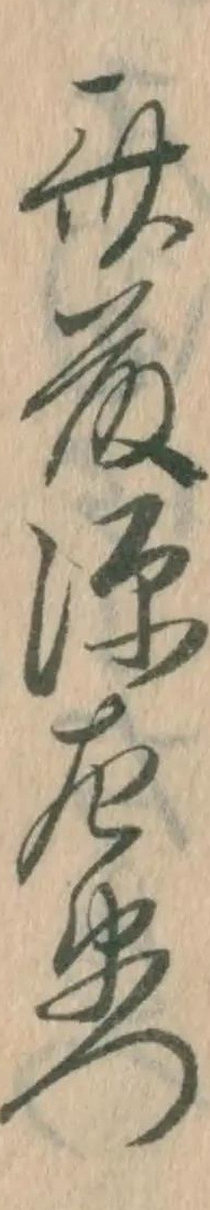斎藤源左衛門
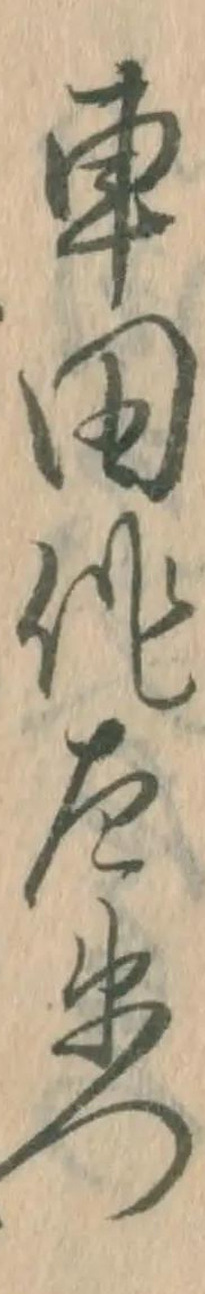車田作左衛門
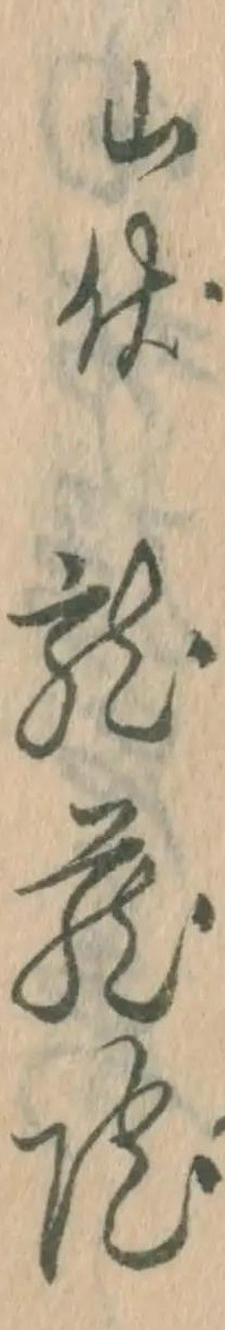山伏龍蔵院

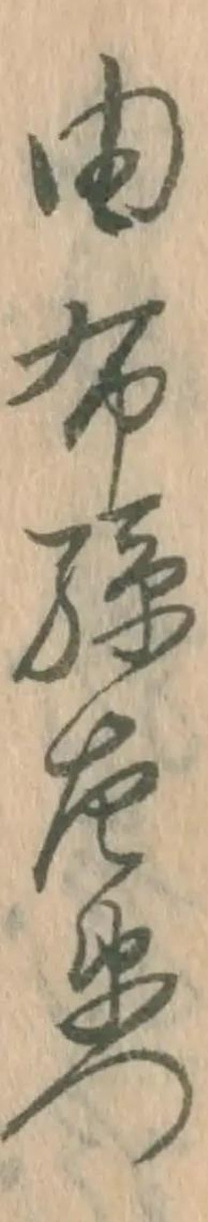由布孫左衛門
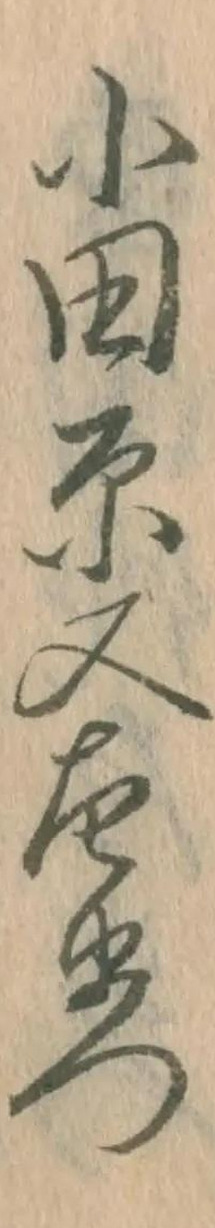小田原又左衛門
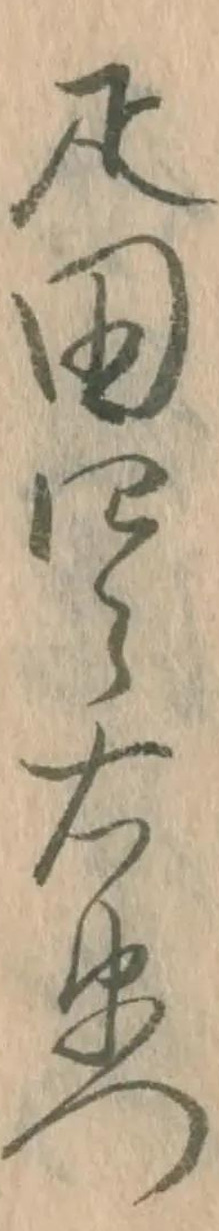疋田四郎右衛門
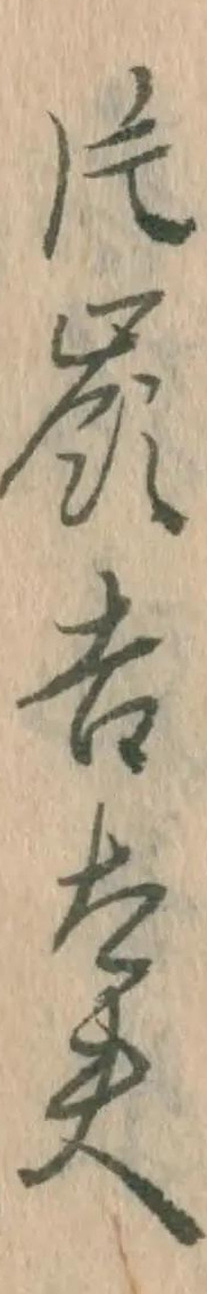片嶺吉太夫
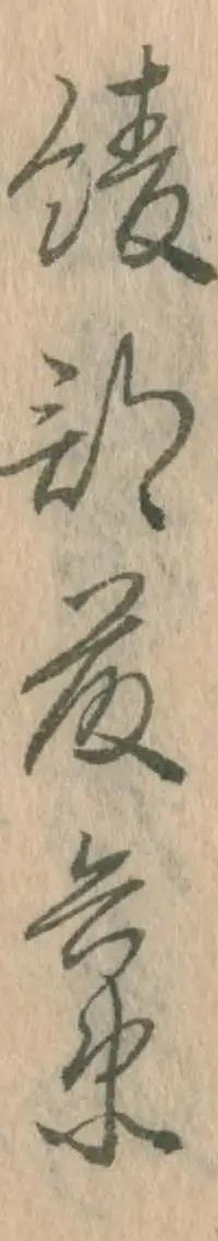綾部藤兵衛
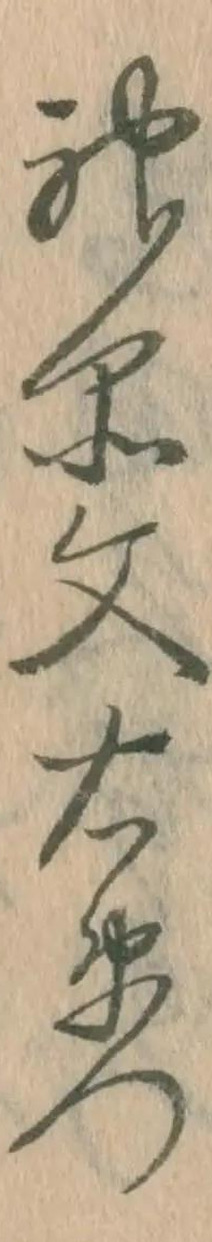神品又右衛門
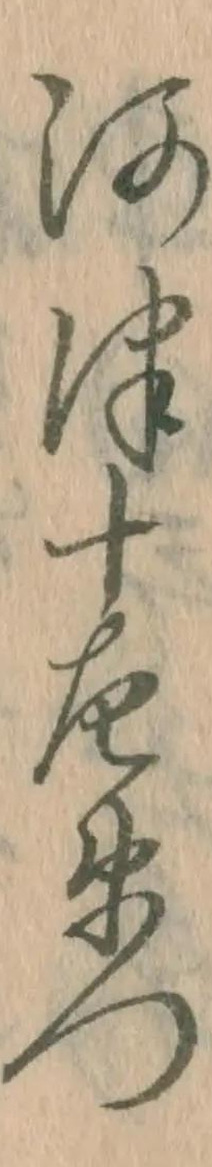河津十左衛門
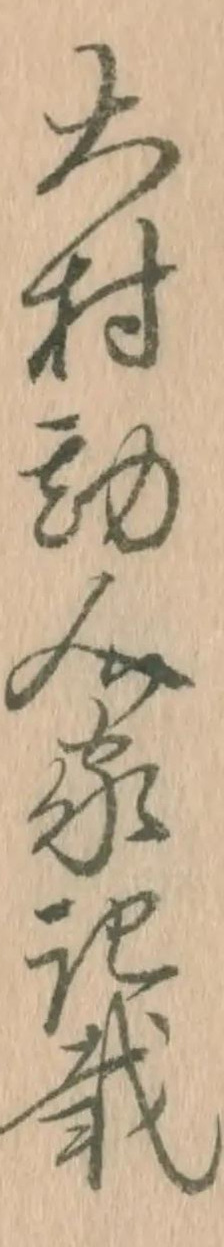大村勘介家記載
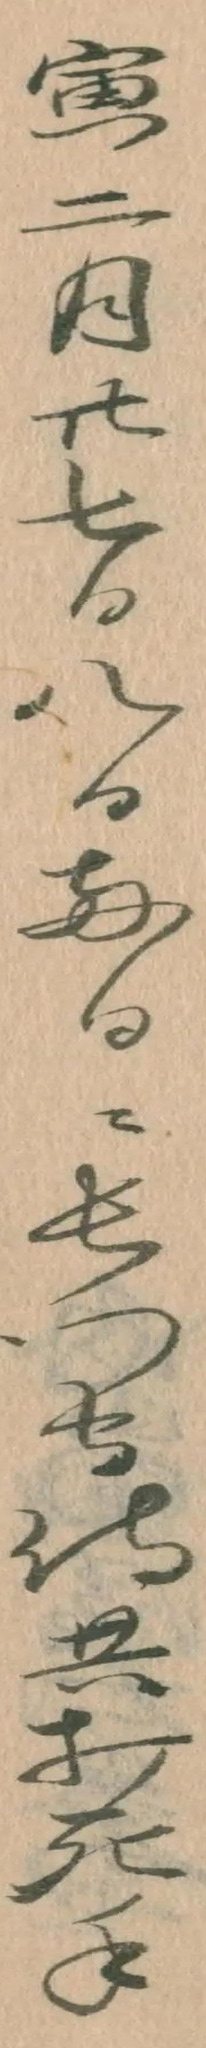寅二月廿七日八日両日に長門守侍共打死手
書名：切支丹御退治記 49巻. [9]
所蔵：国立国会図書館 National Diet Library, JAPAN
